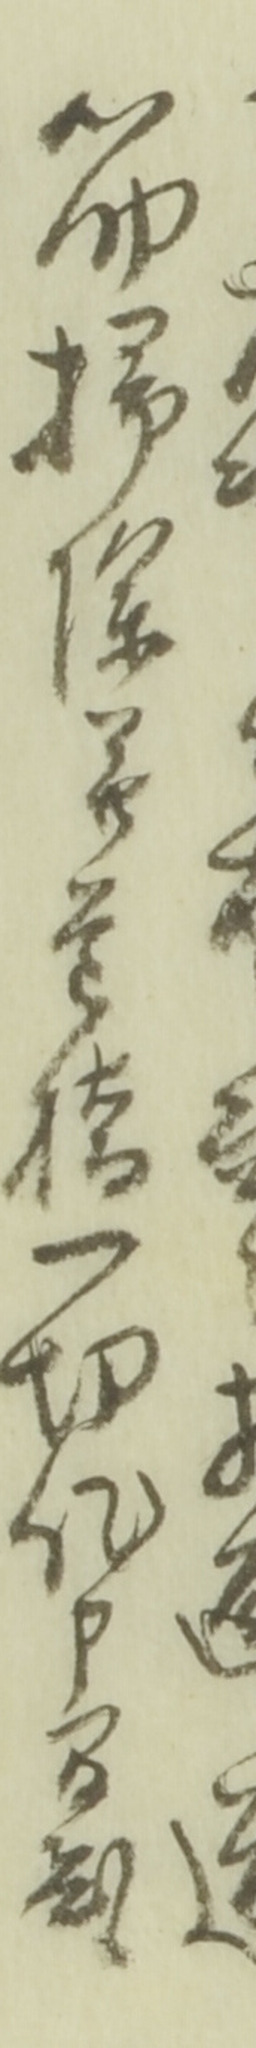筋掃除並道橋一切作申間敷候
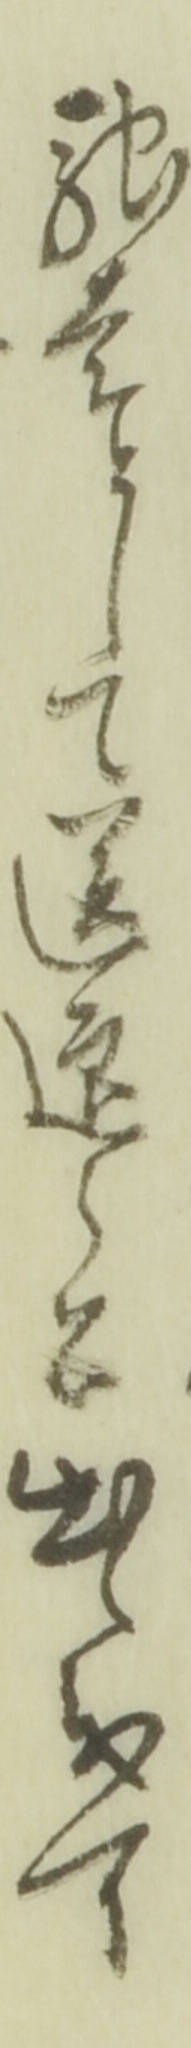馳走として送迎候者出候義可
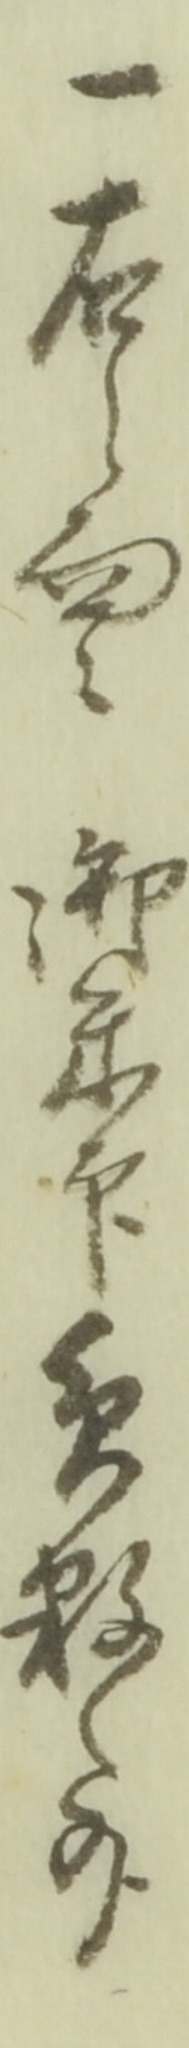一右之面々御朱印員数之外
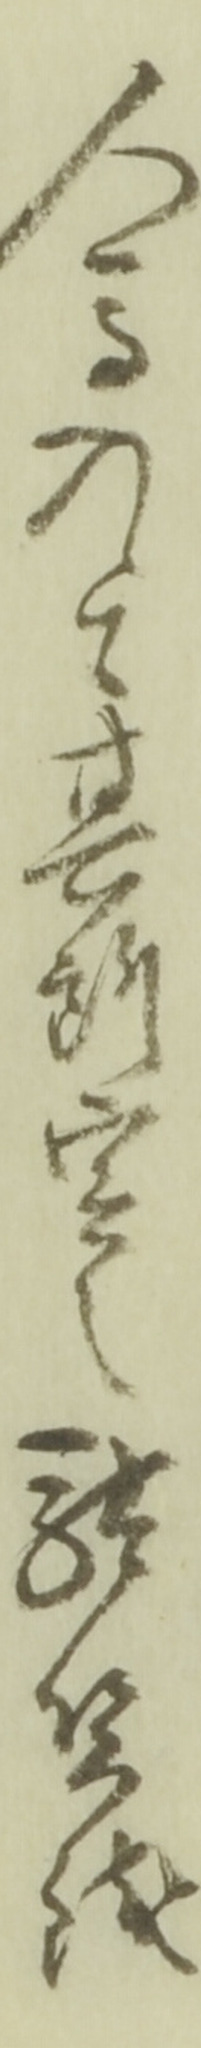人馬入候て其所定之駄賃銭
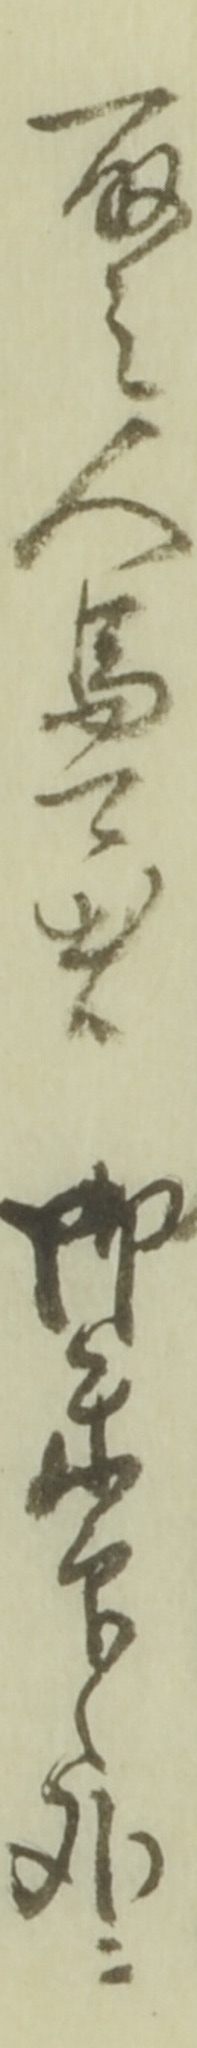所之人馬可出候御朱印之外二
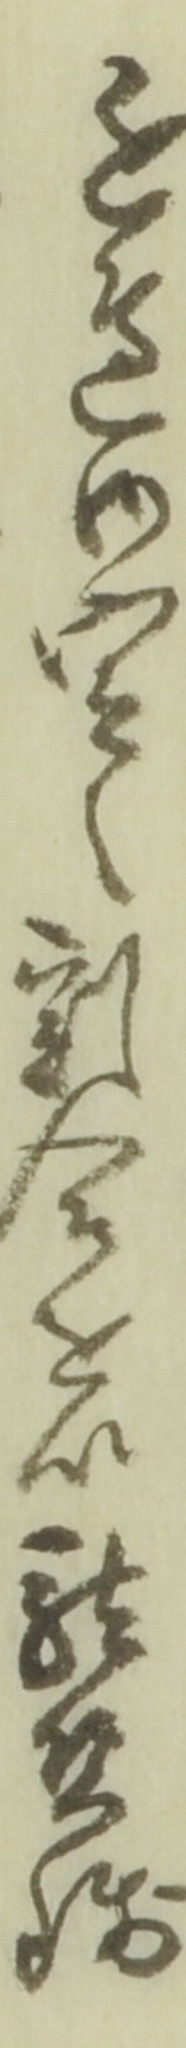近辺御定之割合を以駄賃銭
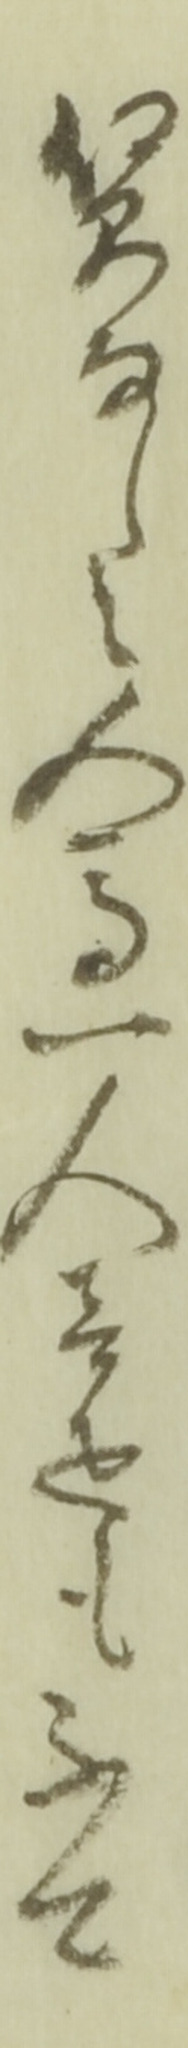賃なし之人馬一人壱疋も不可
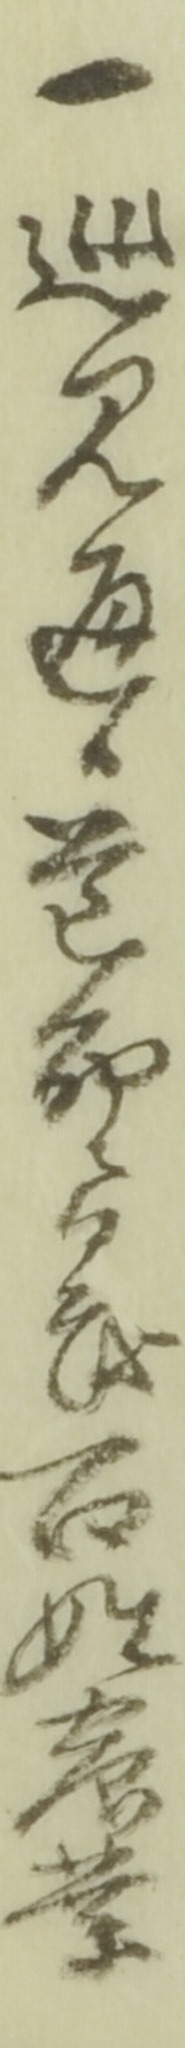一巡見通候道筋二而茂百姓売薬
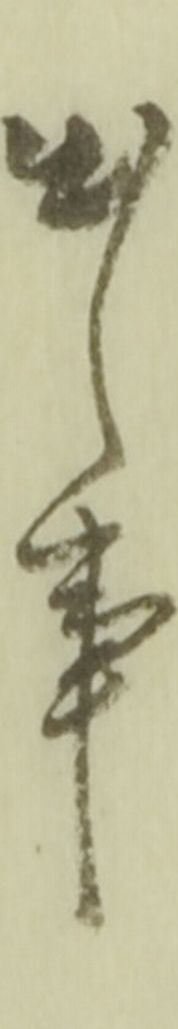出候事
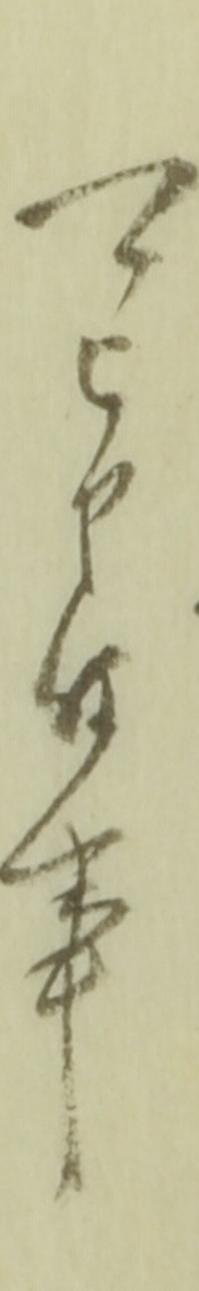可被申付事
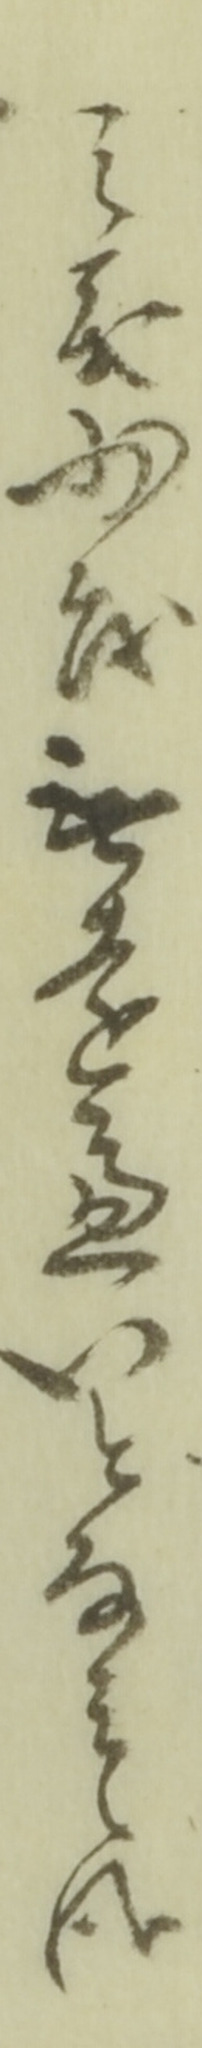之義少茂無遠慮いとなミ候様
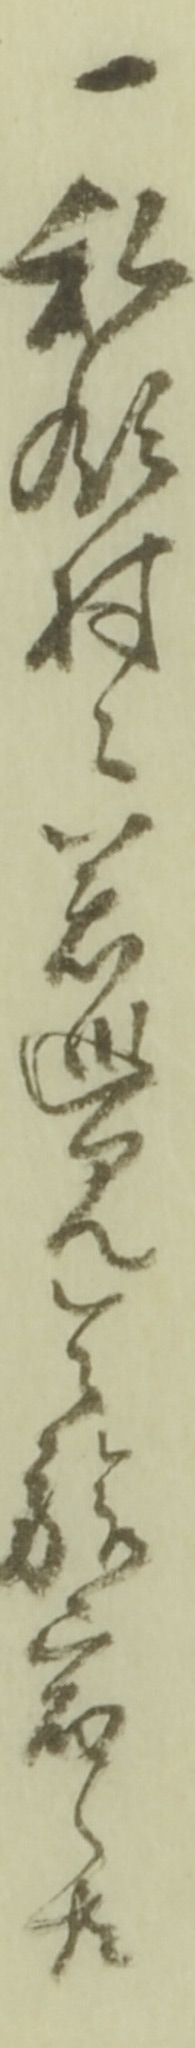一私領村々若巡見族宿候共
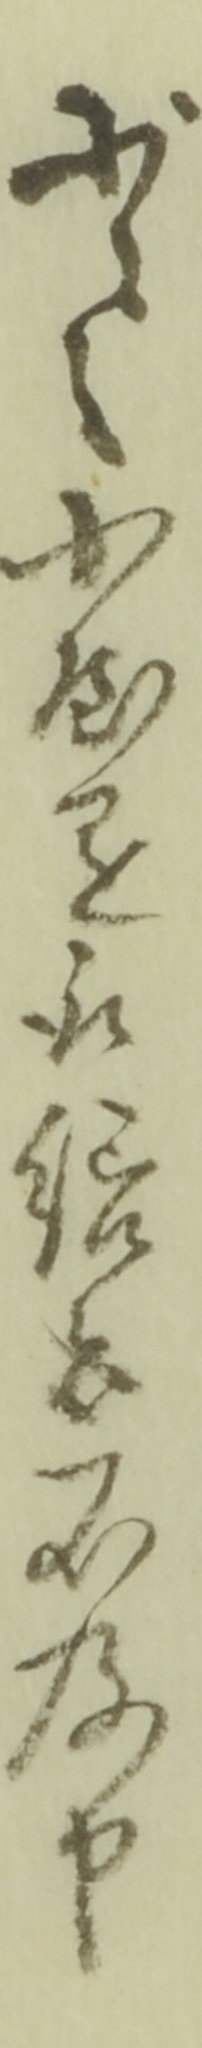少々之小屋懸取縮候者不及申
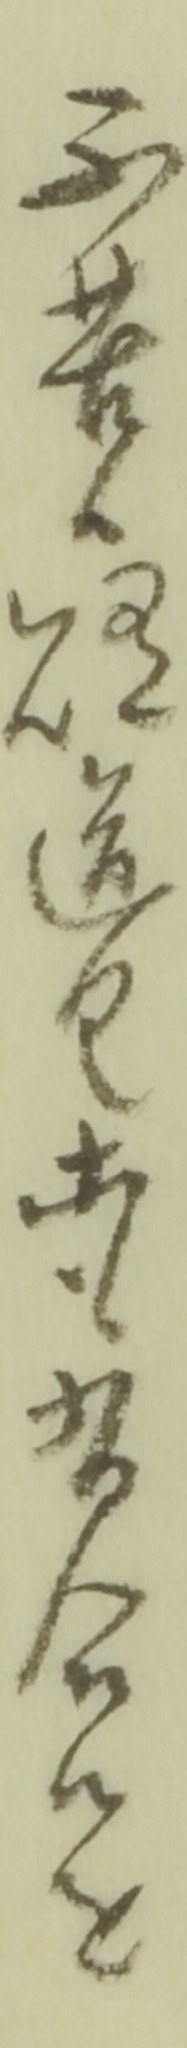不苦し候賄道具等も有合候を
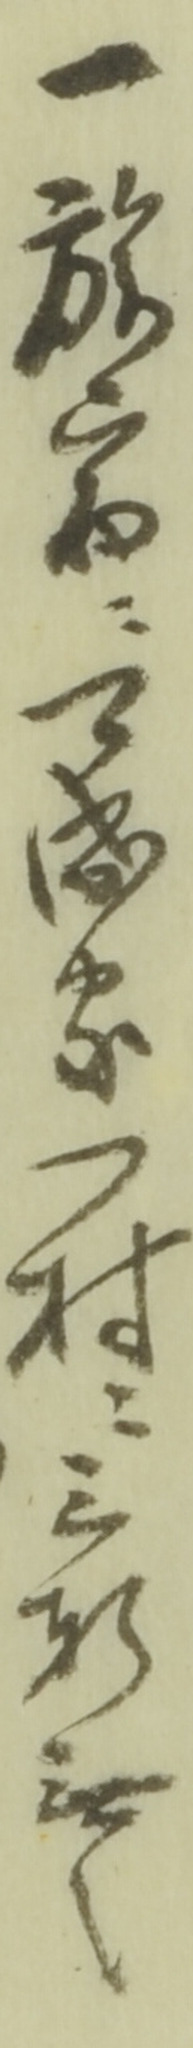一旅宿二可成家一村二三軒無之
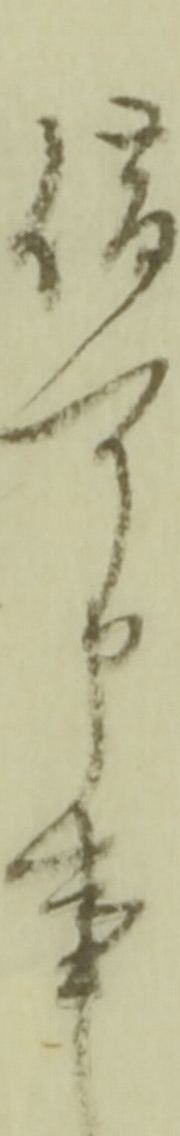借可申事
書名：御公儀様御領主様御触書控
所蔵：伊那市立高遠町図書館・合同会社AMANE
